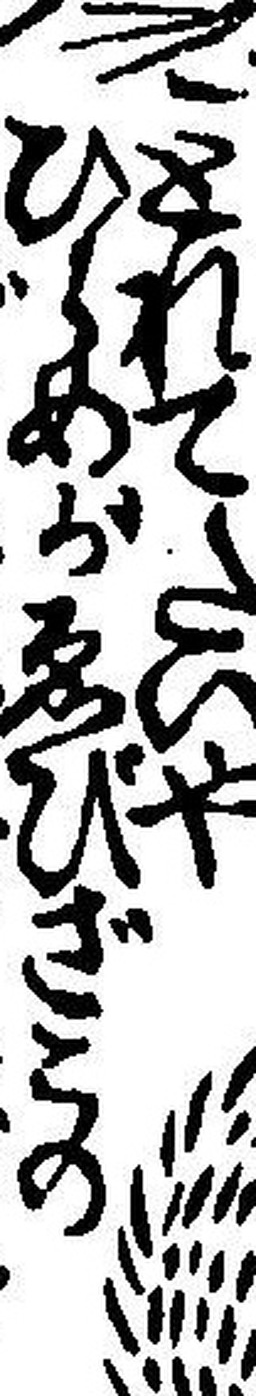ひらめがゑびざこの
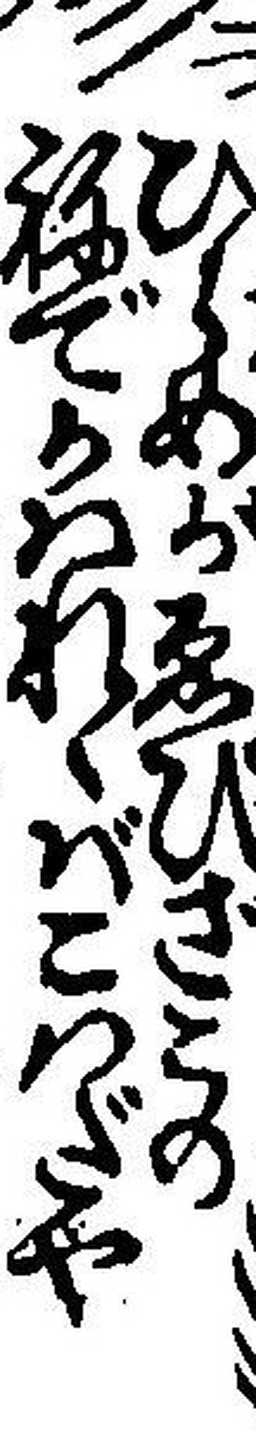ねでかはれゝばこはだや
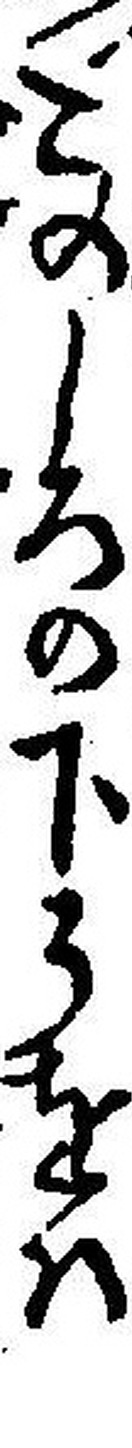このしろの下うをは
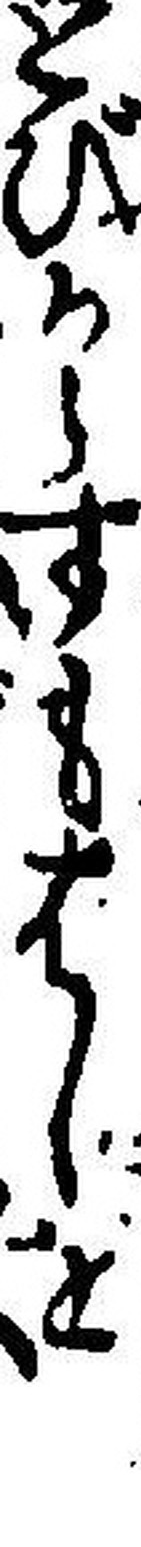とびからすもはしを
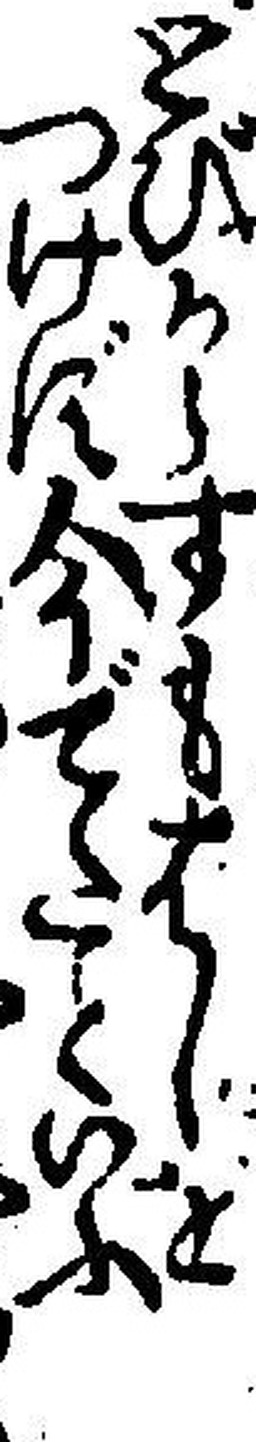つけず今でたといふ
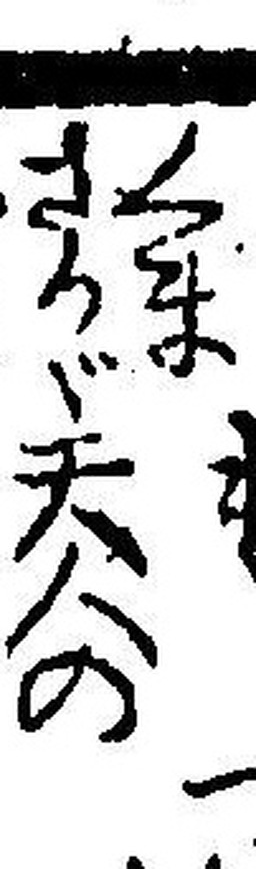さかゞ天人の
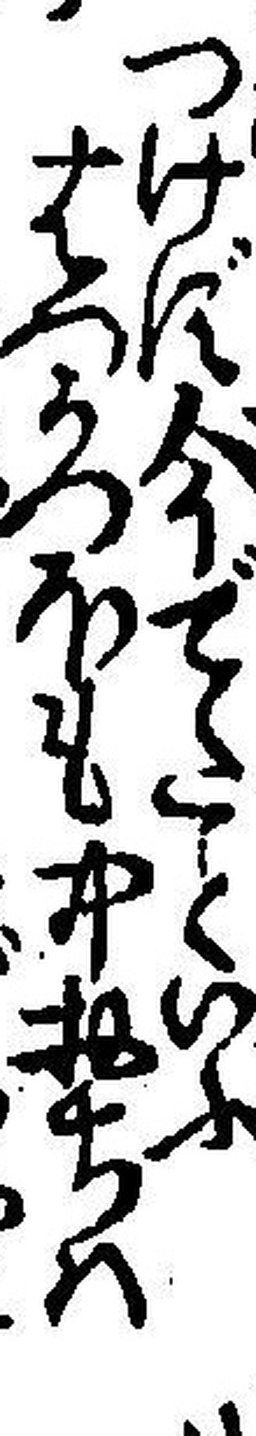はつかつほも中おちは
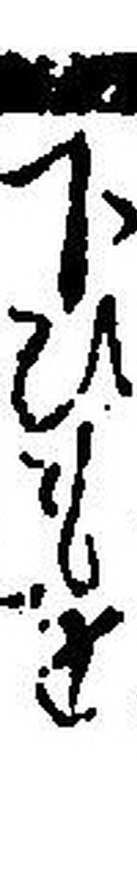下ひもを
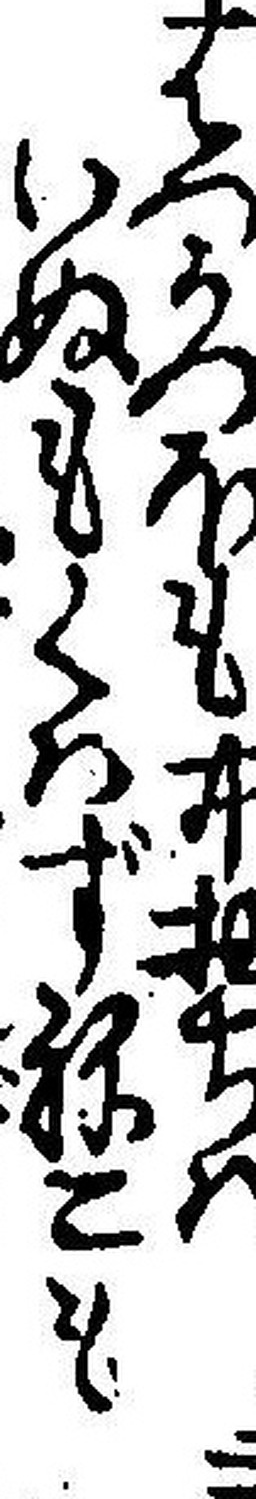いぬもくはずねこも
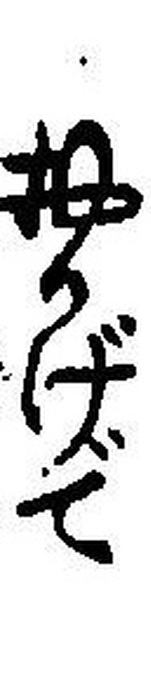おかげで
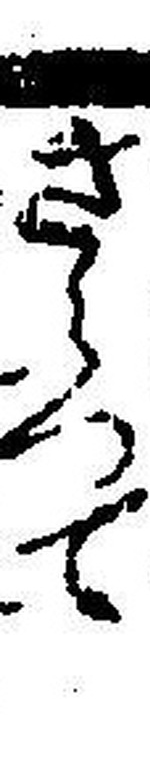さらつて
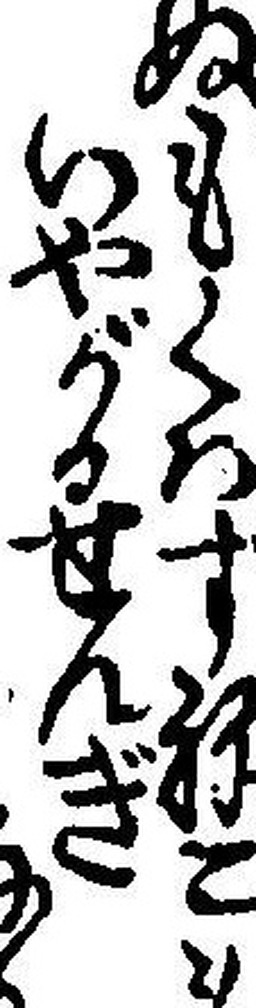いやがるせんぎ
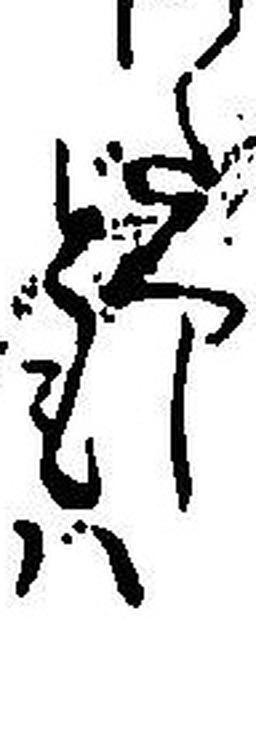どもは
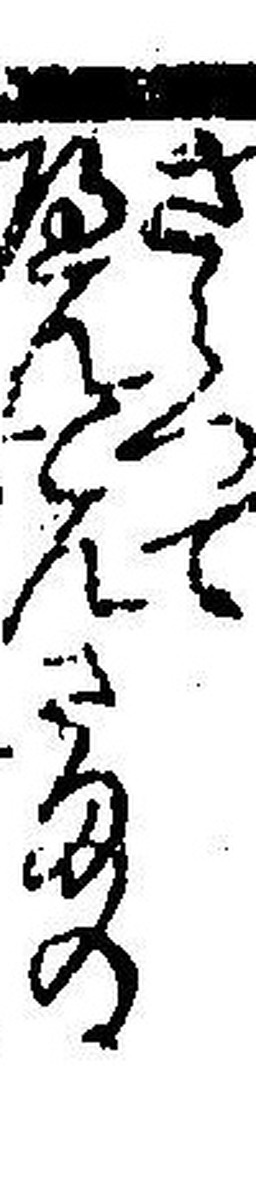へんてんさまの
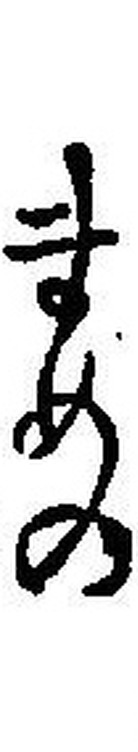まめの
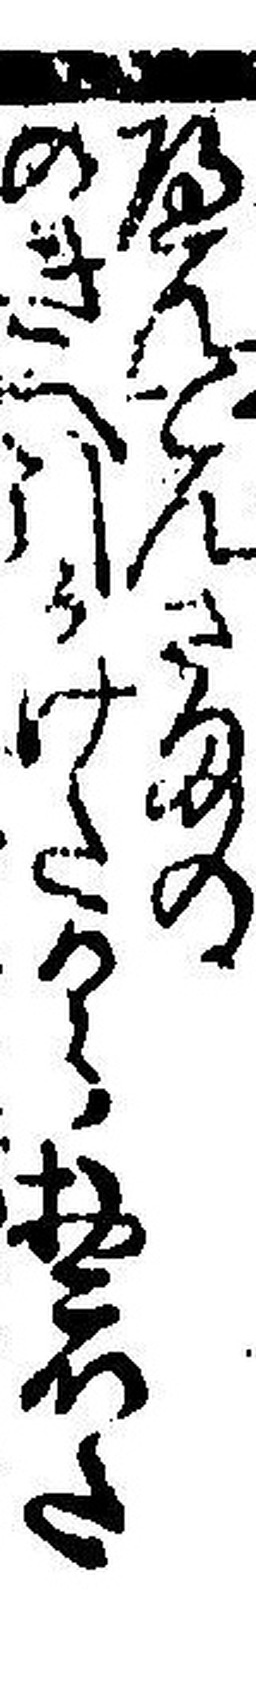のきへ引かけたからおこつた
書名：徳若水縁起金性 / 樹下石上作
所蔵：東京大学総合図書館 General Library in the University of Tokyo, JAPAN
